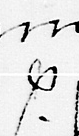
1.)
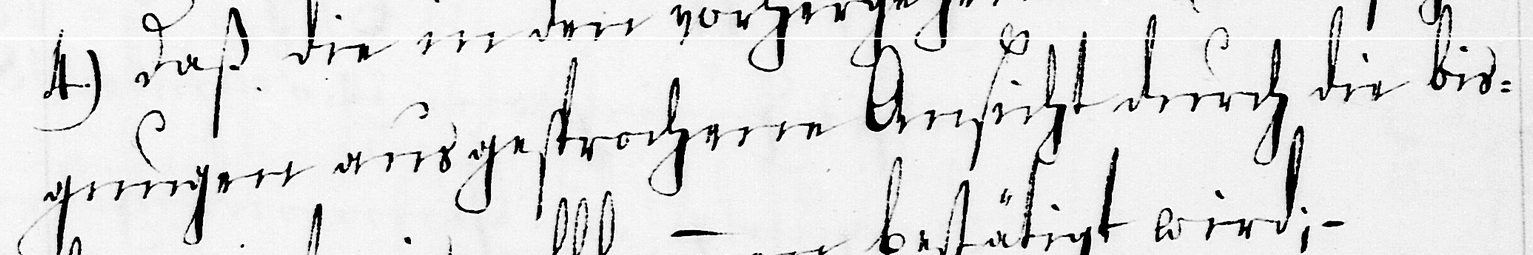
gungen ausgesprochene Ansicht durch die bis¬
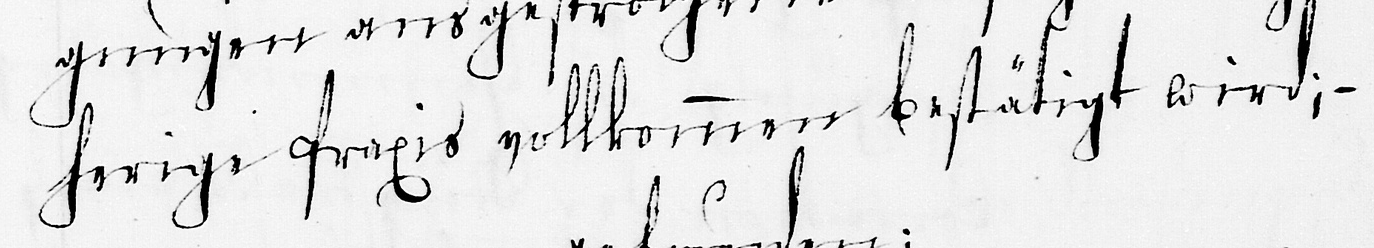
herige Praxis vollkommen bestätigt wird; –
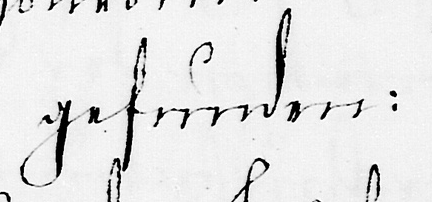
gefunden:
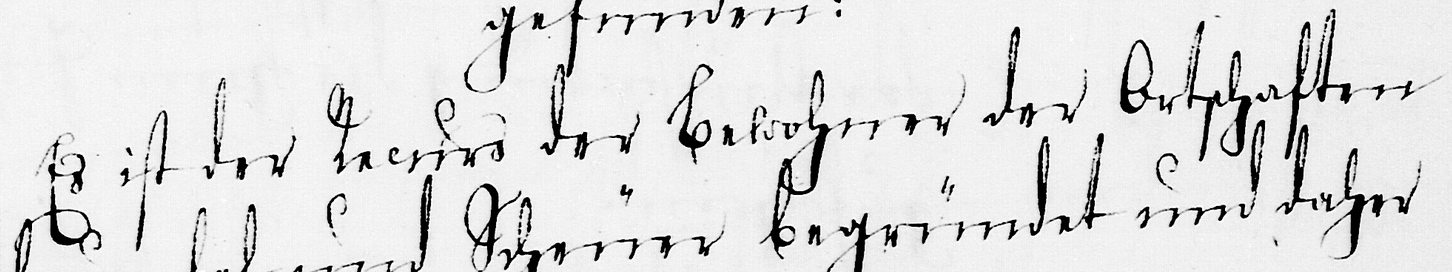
Es ist der Recurs der Bewohner der Ortschaften
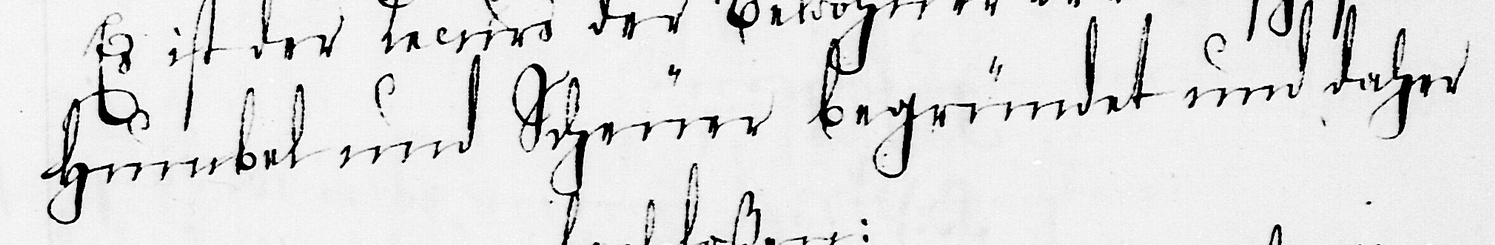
Humbel und Scheuer begründet und daher
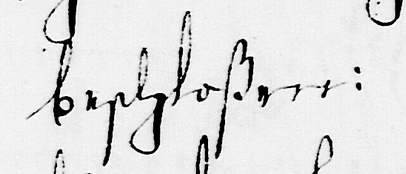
beschloßen:
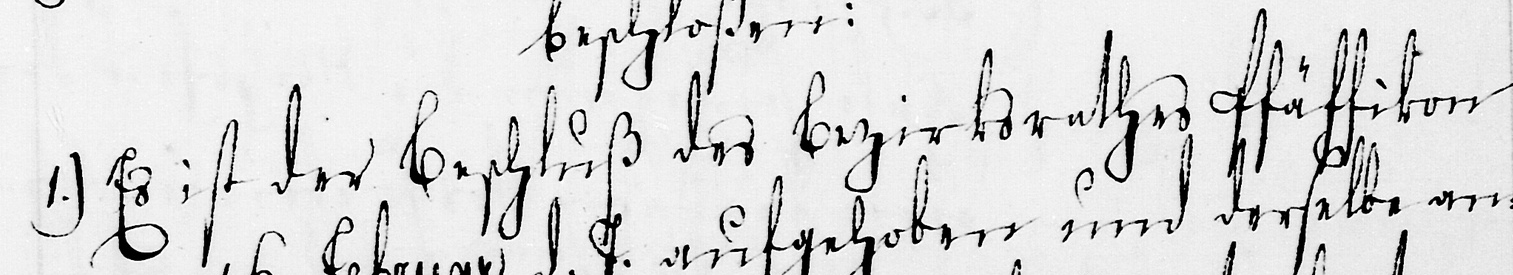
Es ist der Beschluß des Bezirksrathes Pfäffikon
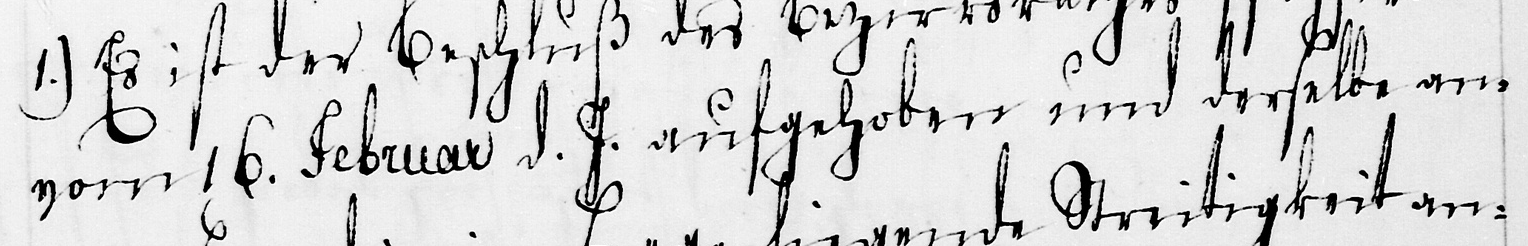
vom 16. Februar d. J. aufgehoben und derselbe an¬
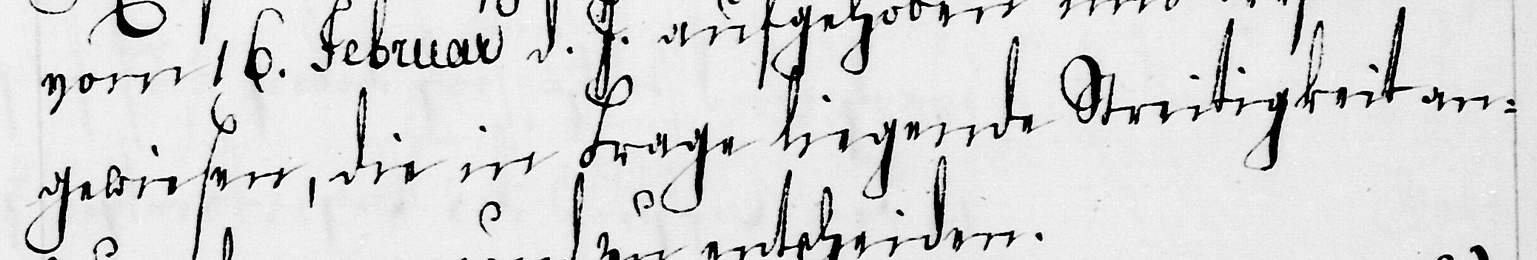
gewiesen, die in Frage liegende Streitigkeit an¬
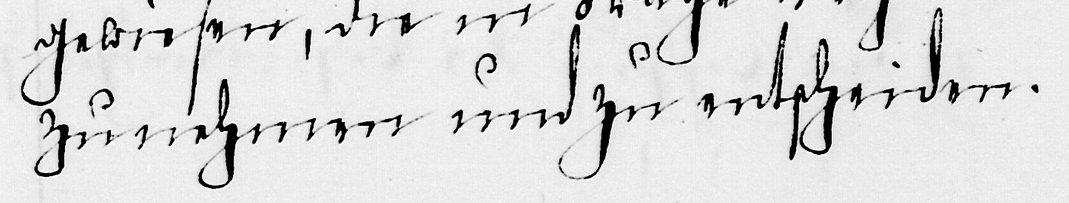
zunehmen und zu entscheiden.
